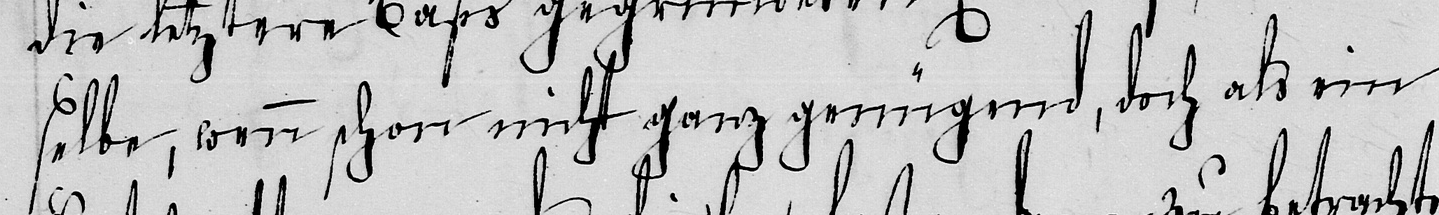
rselbe, wenn schon nicht ganz genügend, doch als ein
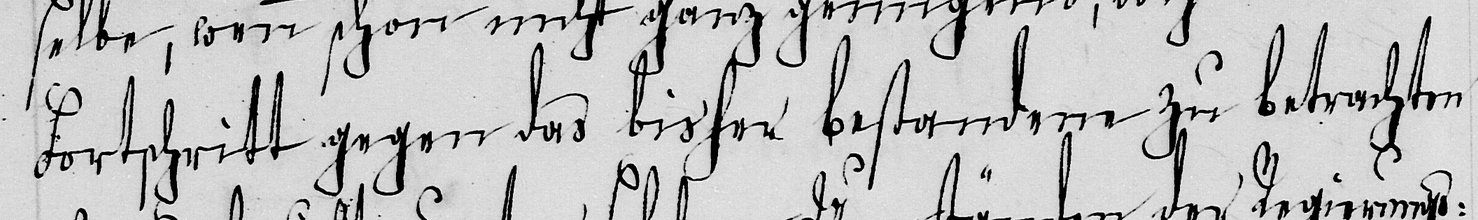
Fortschritt gegen das bisher bestandene zu betrachten
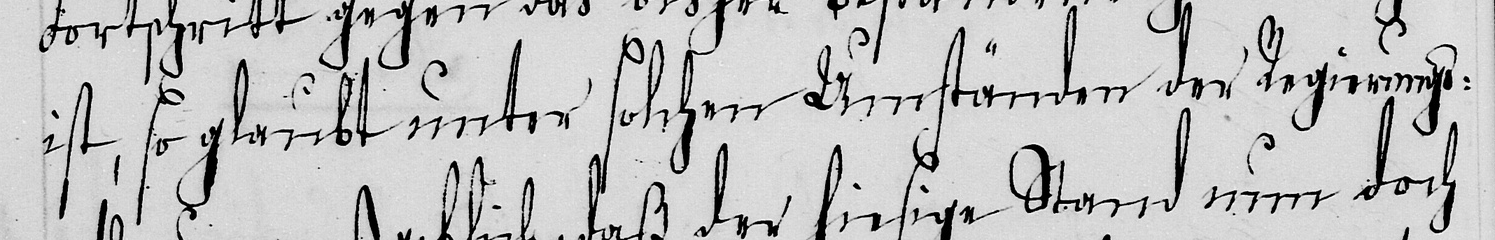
ist, so glaubt unter solchen Umständen der Regierung¬
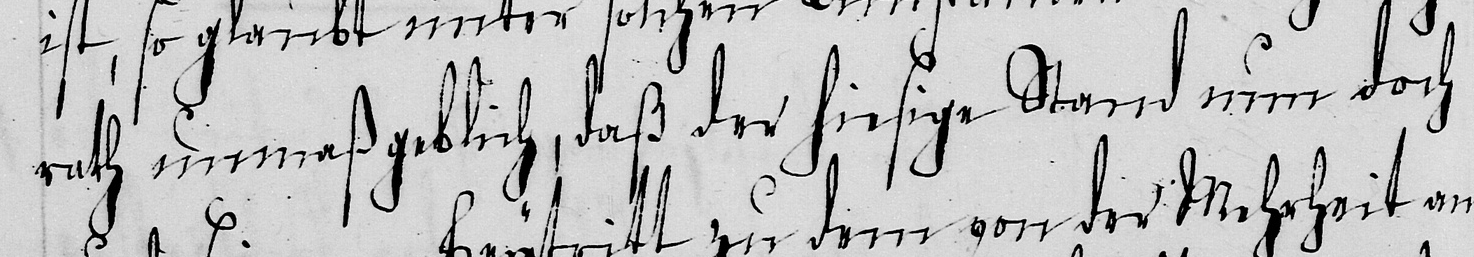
srath unmaßgeblich, daß der hiesige Stand nun doch
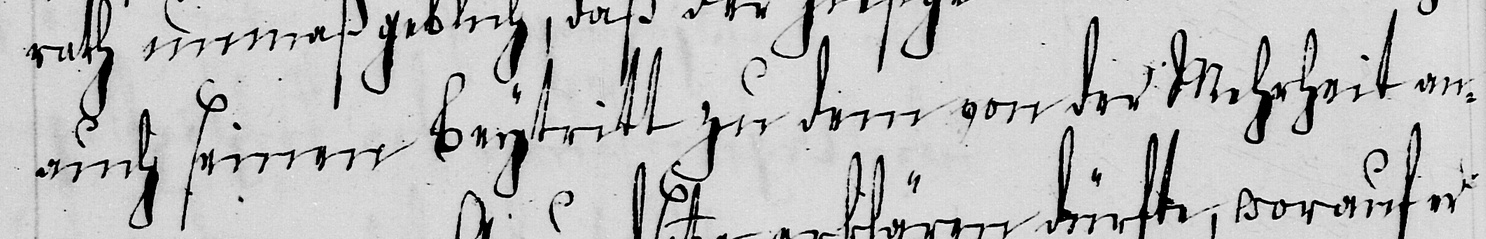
auch seinen Beytritt zu dem von der Mehrheit an¬
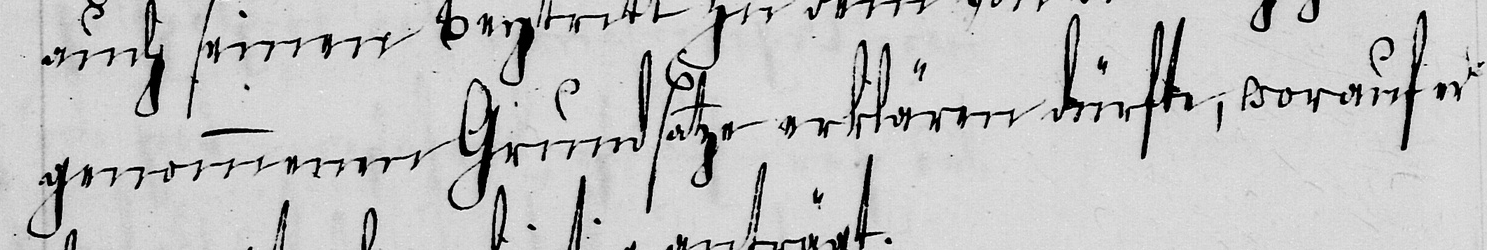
genommenen Grundsatze erklären dürfte, worauf er
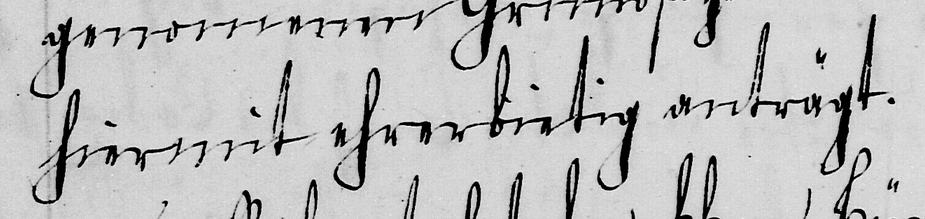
hiermit ehrerbietig anträgt.
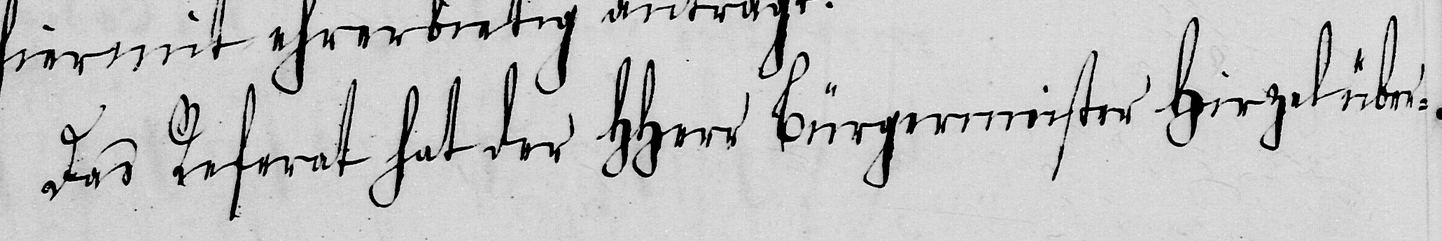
Das Referat hat der HHerr Bürgermeister Hirzel übe¬
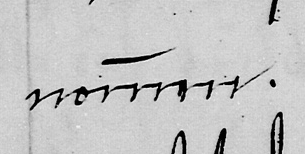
rnommen.
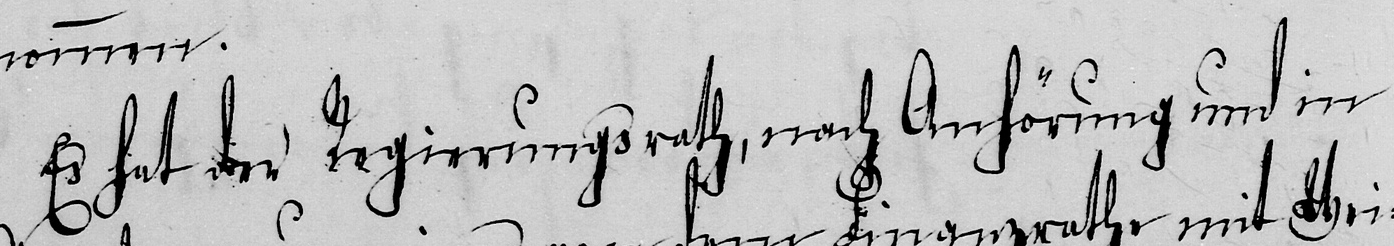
Es hat der Regierungsrath, nach Anhörung und in
